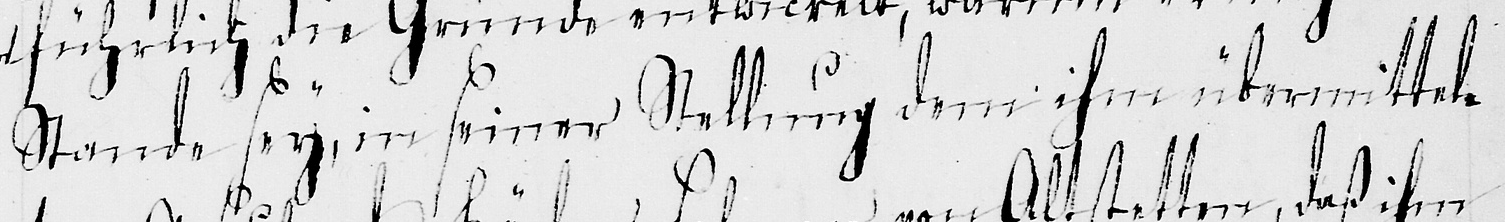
Stande sey, in seiner Stellung dem ihm übermittel¬
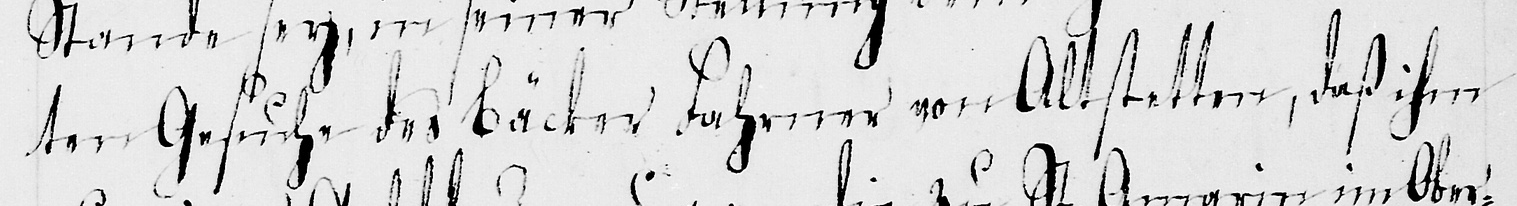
ten Gesuche des Bäcker Fahrner von Altstetten, daß ihm
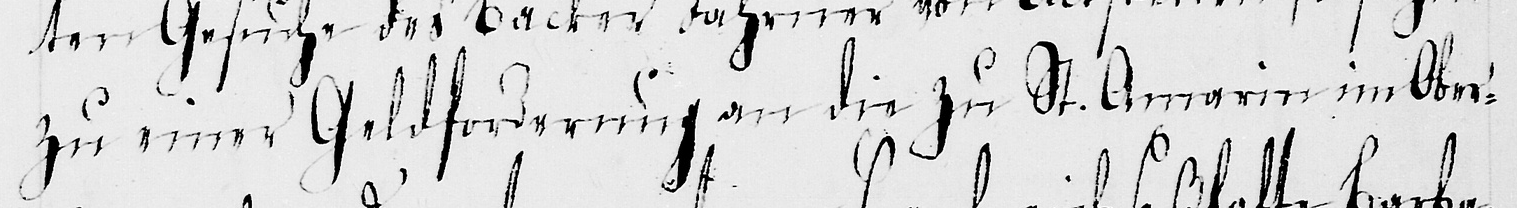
zu einer Geldforderung an die zu St. Amarin im Ober¬
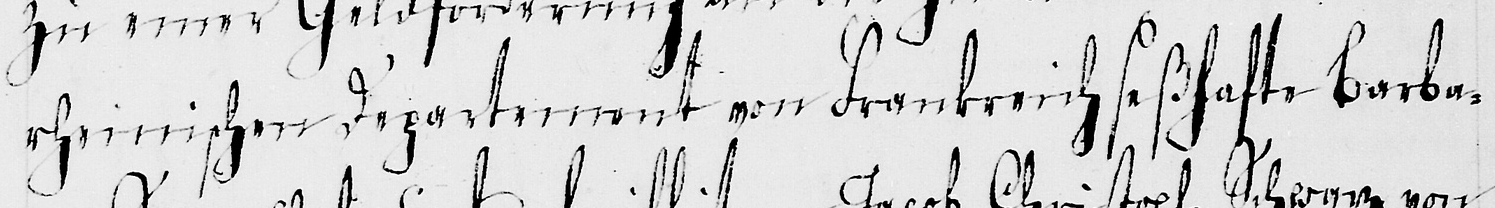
rheinischen Departement von Frankreich seßhafte Barba¬
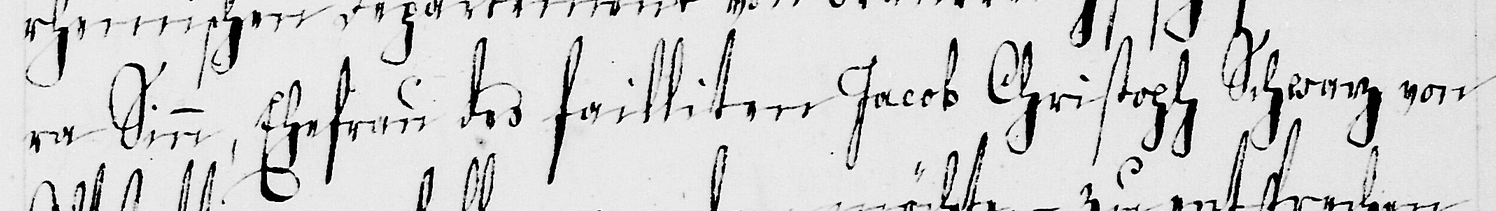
ra Sinn, Ehefrau des failliten Jacob Christoph Schwarz von
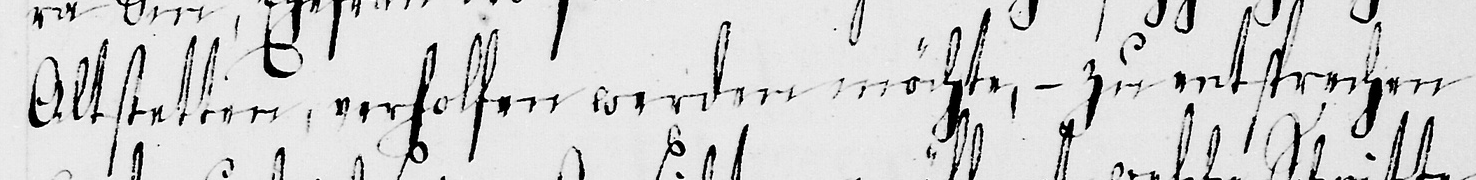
Altstetten, verholfen werden möchte, – zu entsprechen
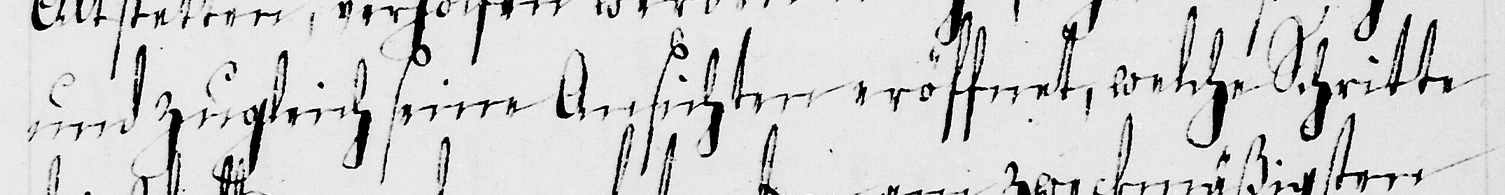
und zugleich seine Ansichten eröffnet, welche Schritte
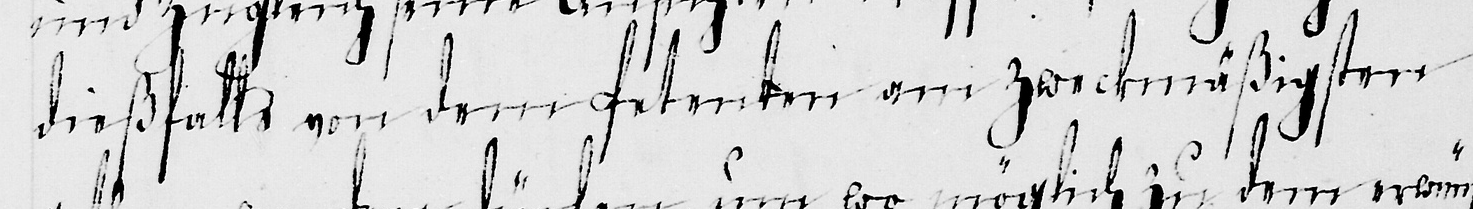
dießfalls von dem Petenten am zweckmäßigsten
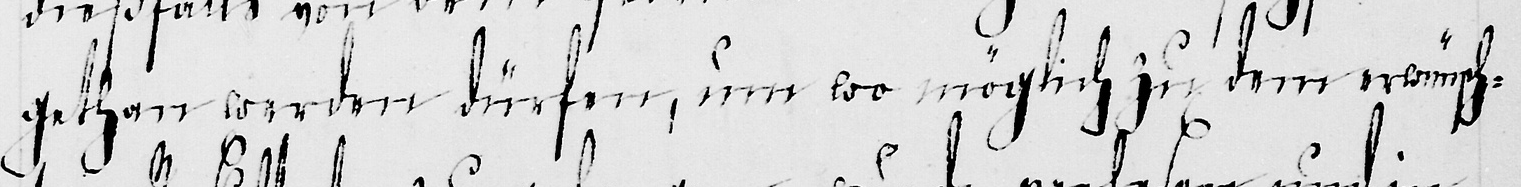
gethan werden dürfen, um wo möglich zu dem erwünsch¬
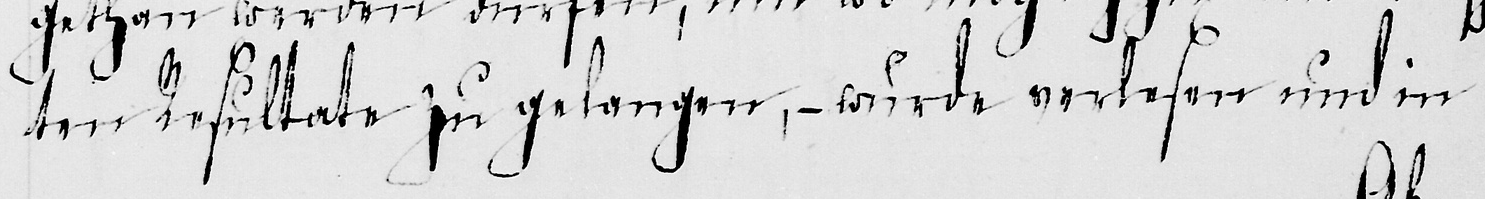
ten Resultate zu gelangen, – wurde verlesen und in
